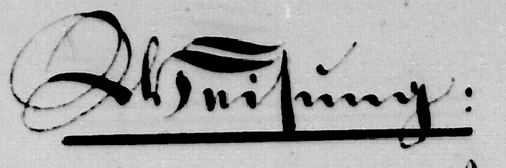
Weisung:
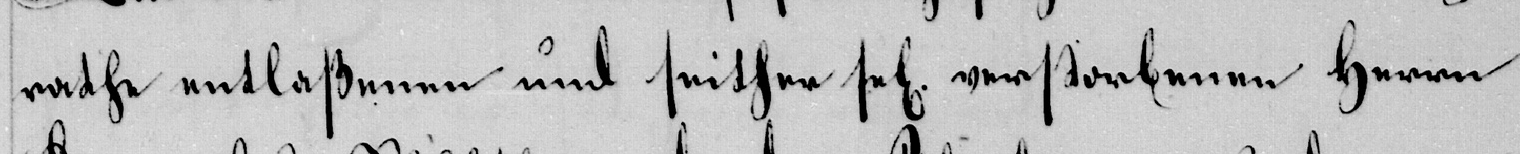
rathe entlaßenen und seither sel[ig] verstorbenen Herrn
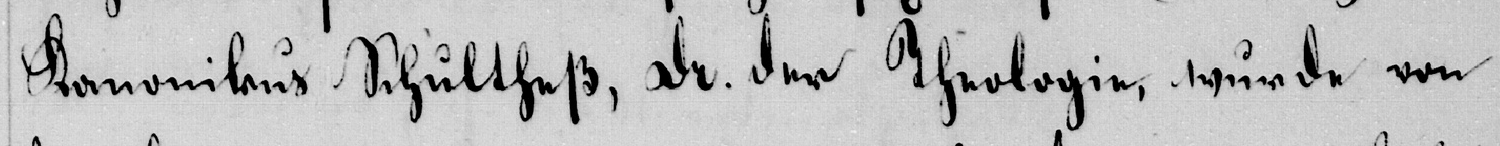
Kanonikus Schultheß, Dr. der Theologie, wurde von
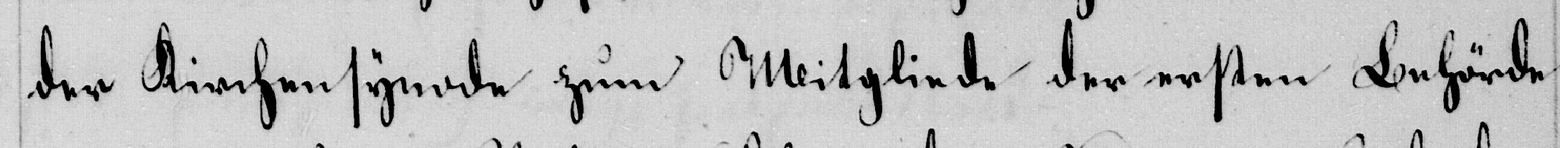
der Kirchensynode zum Mitgliede der ersten Behörde
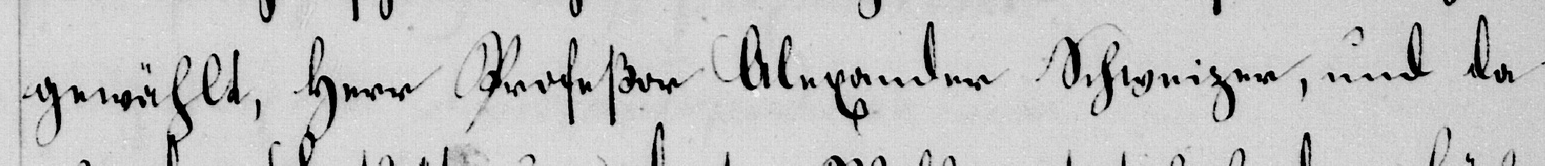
gewählt, Herr Profeßor Alexander Schweizer, und da
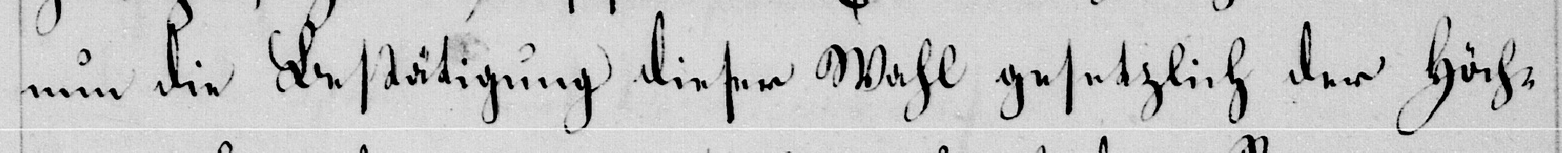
nun die Bestätigung dieser Wahl gesetzlich der Höch¬
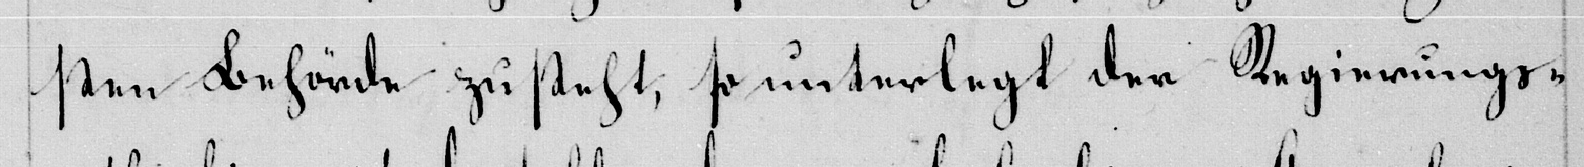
sten Behörde zusteht, so unterlegt der Regierungs¬
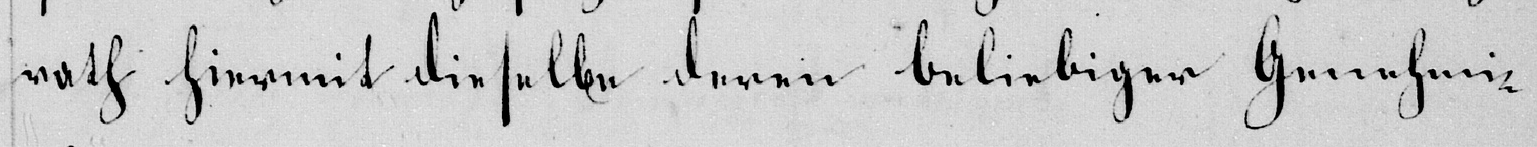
rath hiermit dieselbe deren beliebiger Genehmi¬
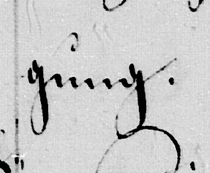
gung.
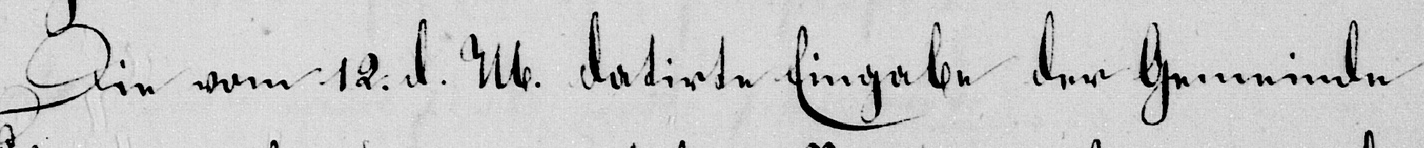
Die vom 12. d. M. datirte Eingabe der Gemeinde
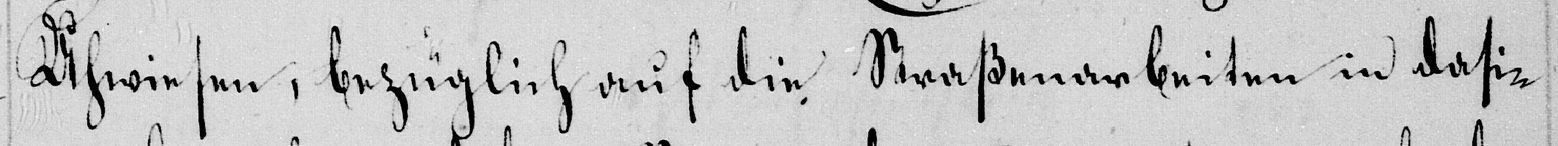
Uhwiesen, bezüglich auf die Straßenarbeiten in dasi¬
